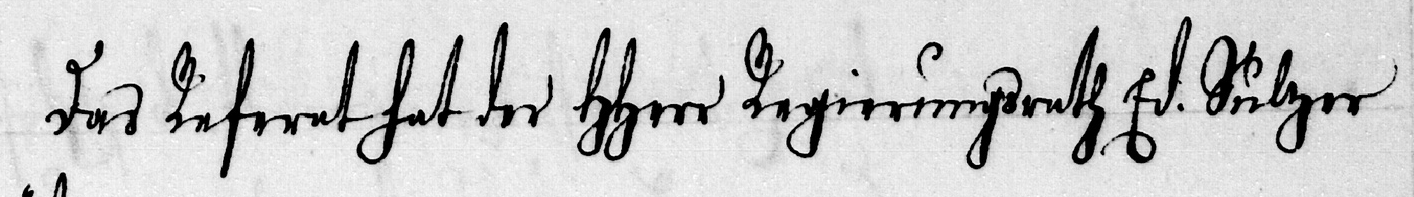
Das Referat hat der HHerr Regierungsrath Ed. Sulzer
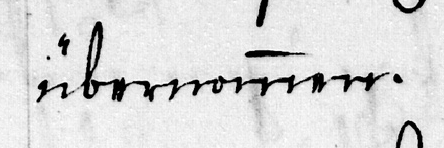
übernommen.
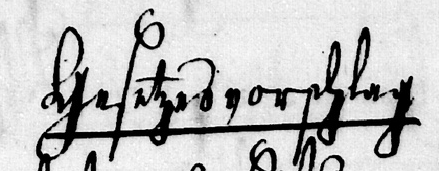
Gesetzesvorschlag
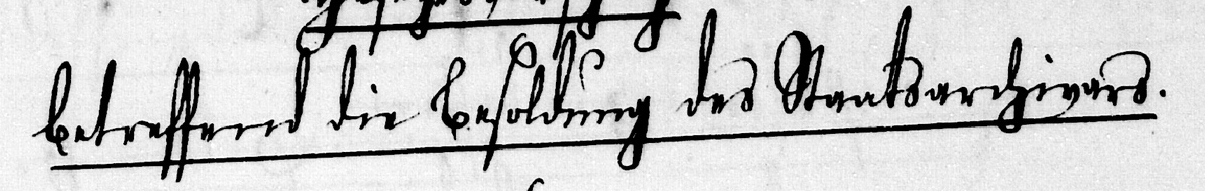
betreffend die Besoldung des Staatsarchivars.
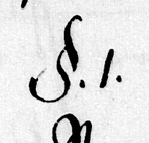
§. 1.
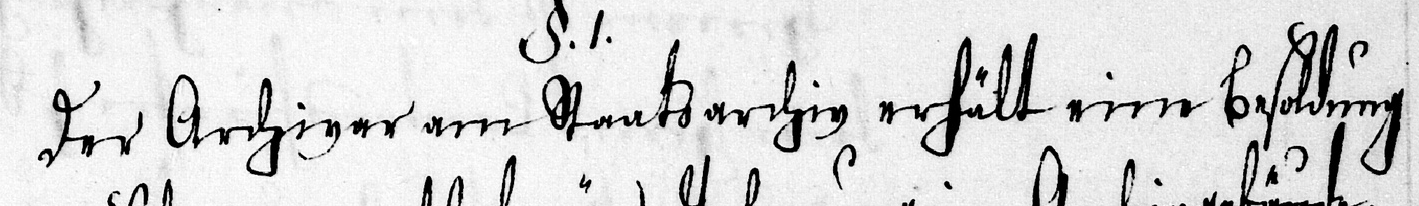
Der Archivar am Staatsarchiv erhält eine Besoldung
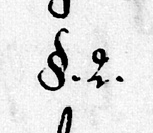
§. 2.
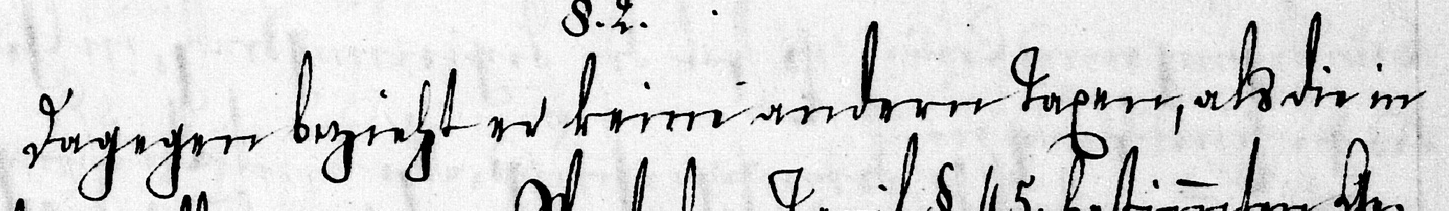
Dagegen bezieht er keine anderen Taxen, als die in
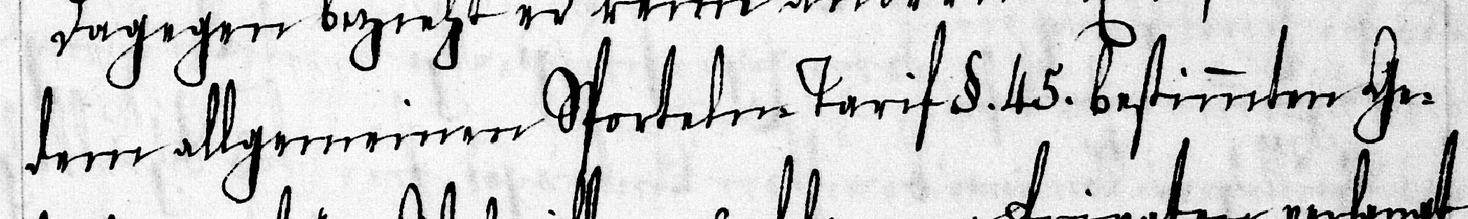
dem allgemeinen Sporteln-Tarif §. 45. bestimmten Ge¬
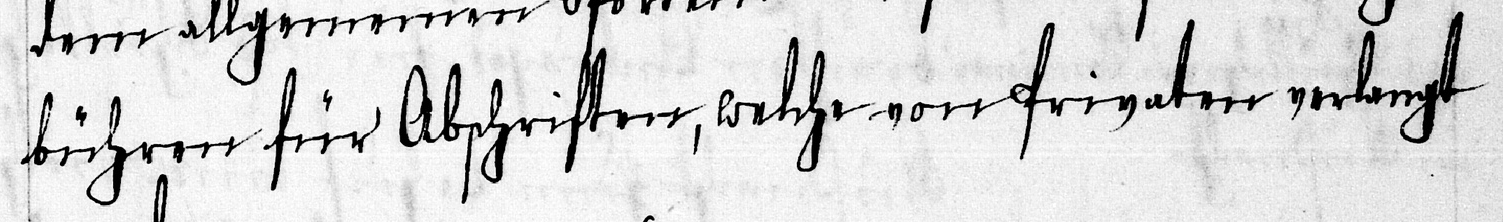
bühren für Abschriften, welche von Privaten verlangt
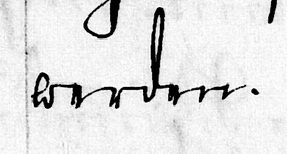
werden.
